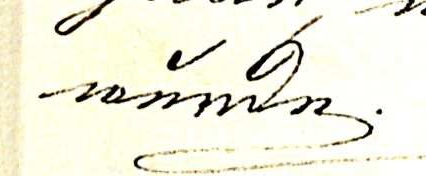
wurde.
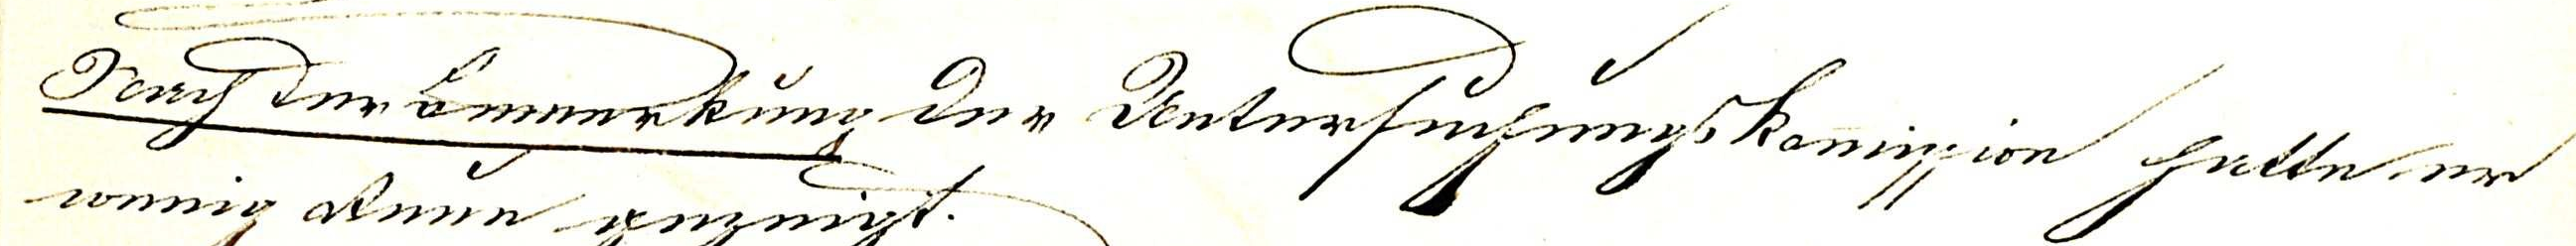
Nach der Bemerkung der Untersuchungskommission hatte er
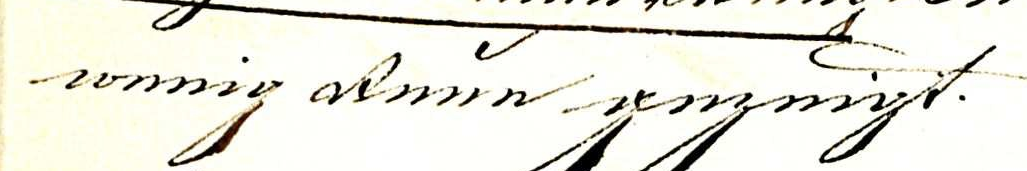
wenig Reue gezeigt.
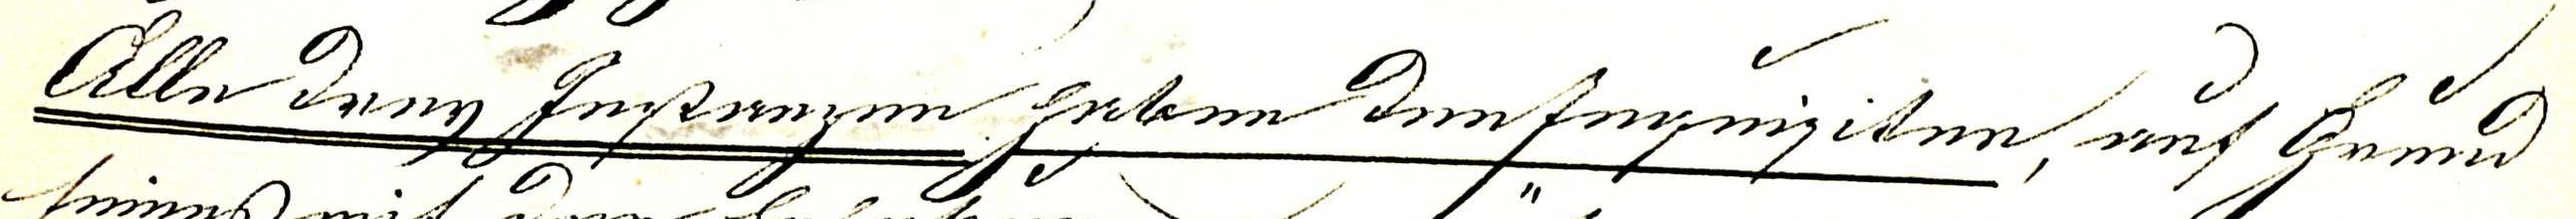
Alle drey Instanzen haben den Inquisiten, auf Grund
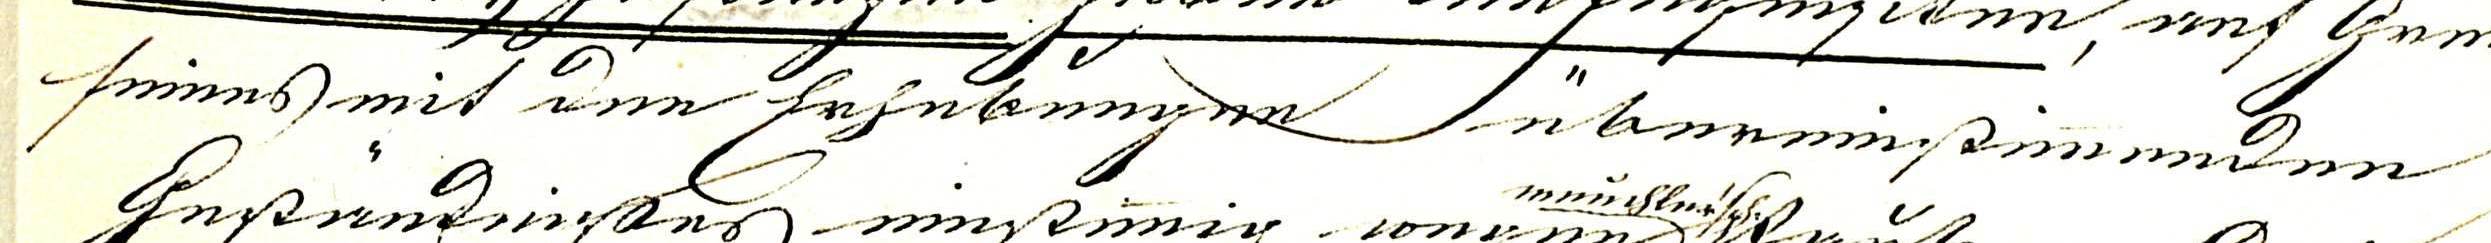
seines mit den Erhebungen übereinstimmenden
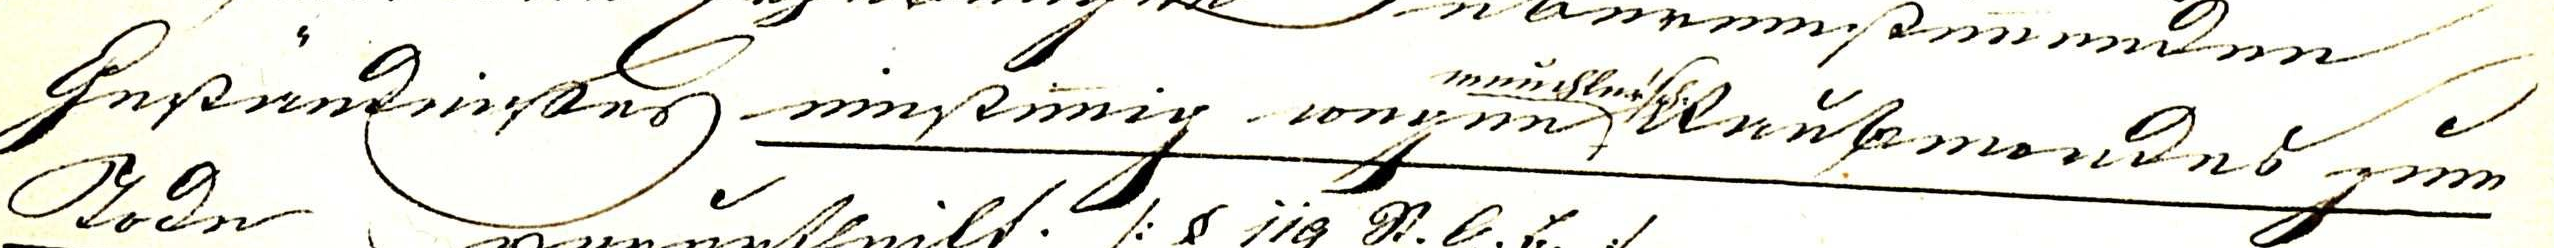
Geständnißes einstimmig wegen meuchlerischen Raubmord zum
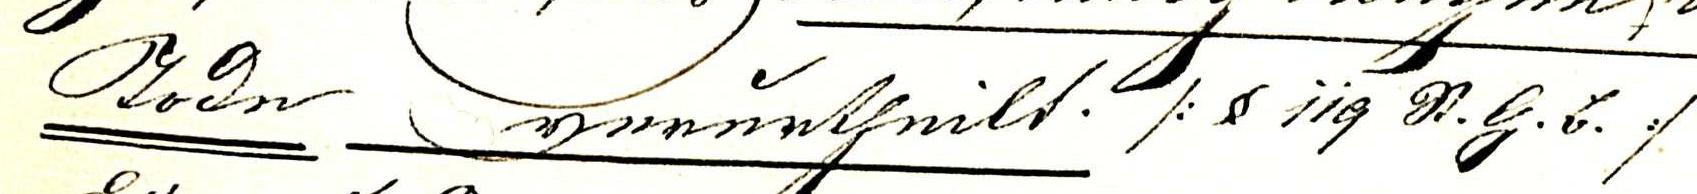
Tode verurtheilt (§119 StGB)
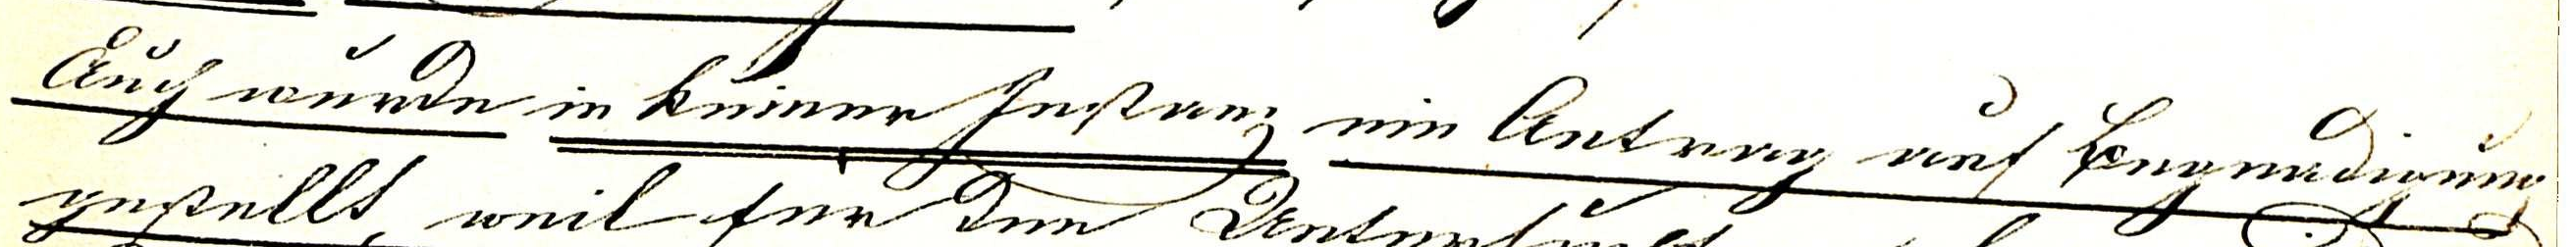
Auch wurde in keiner Instanz ein Antrag auf Begnadigung
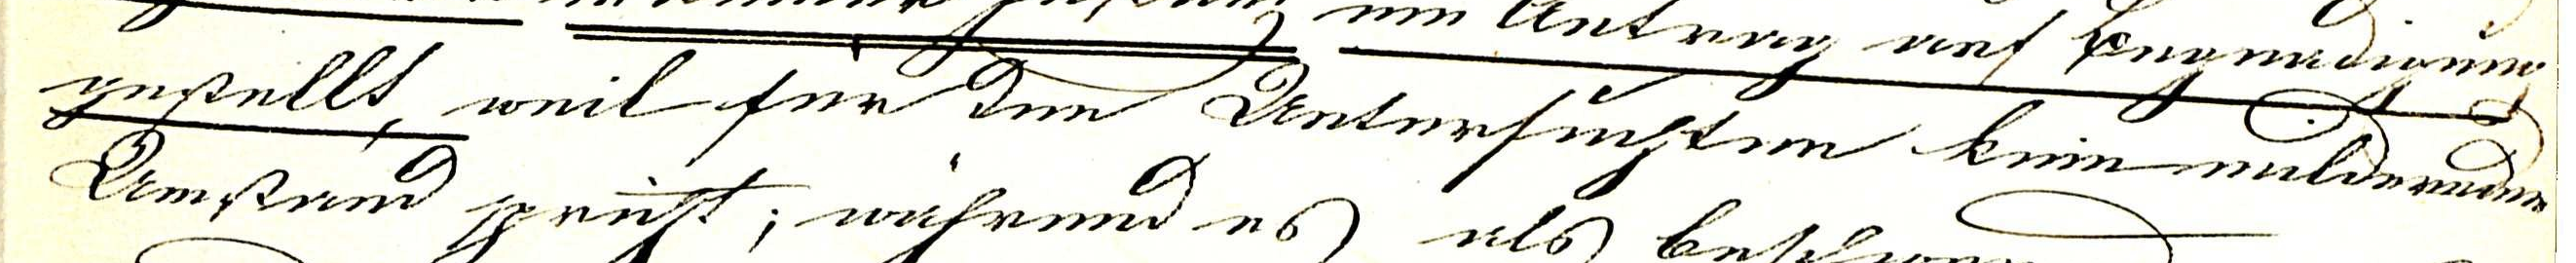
gestellt, weil für den Untersuchten kein mildernden
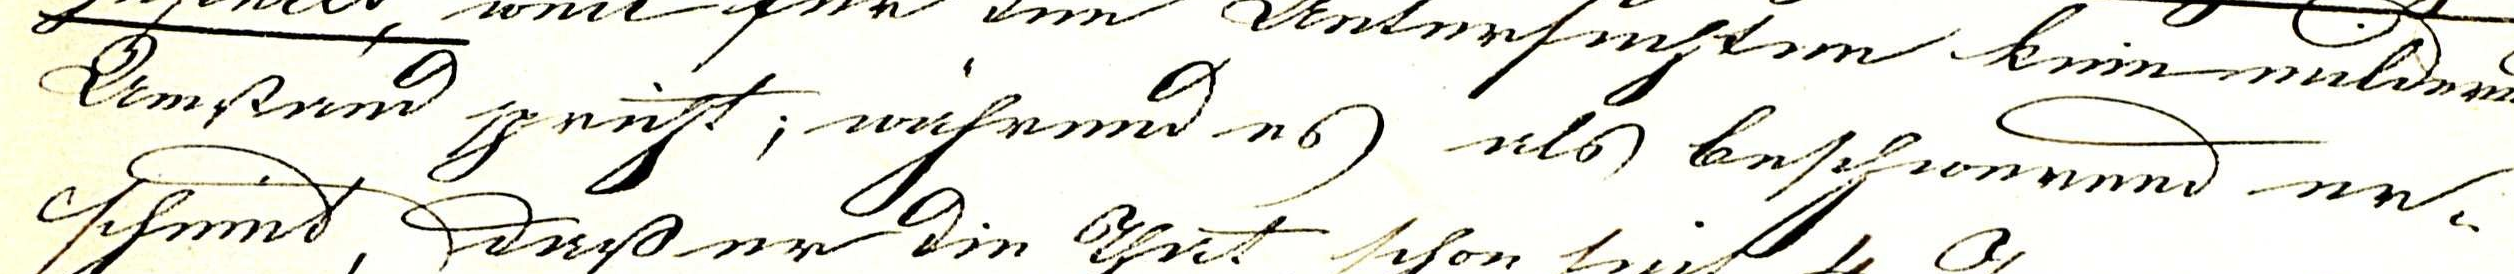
Umstand spricht, während es als beschwerend er¬
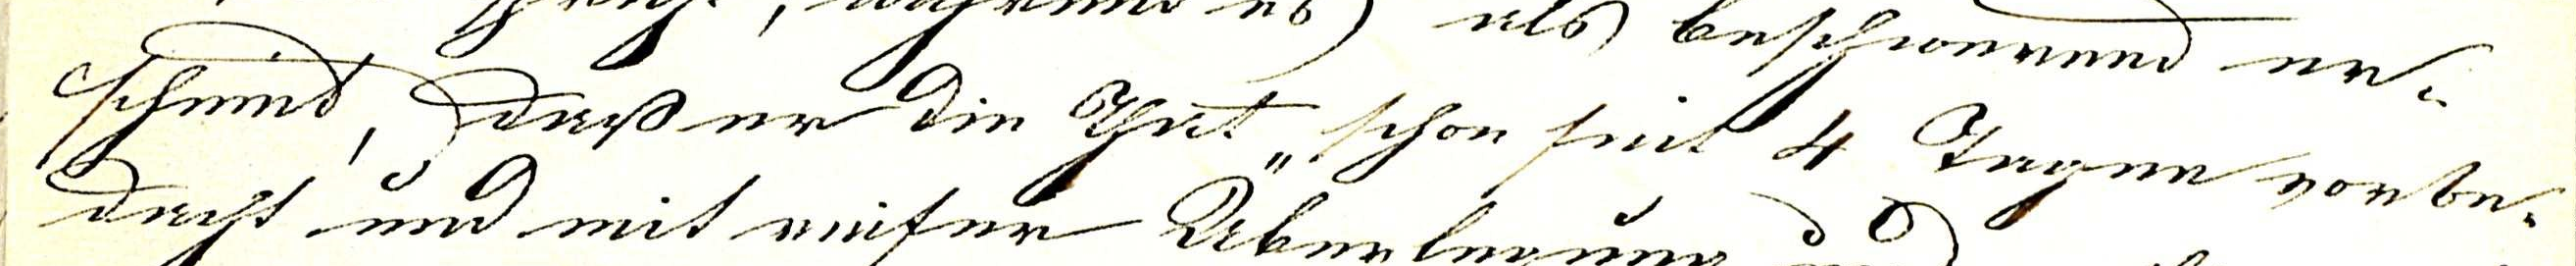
scheint, daß er die That schon seit 4 Tagen von be¬
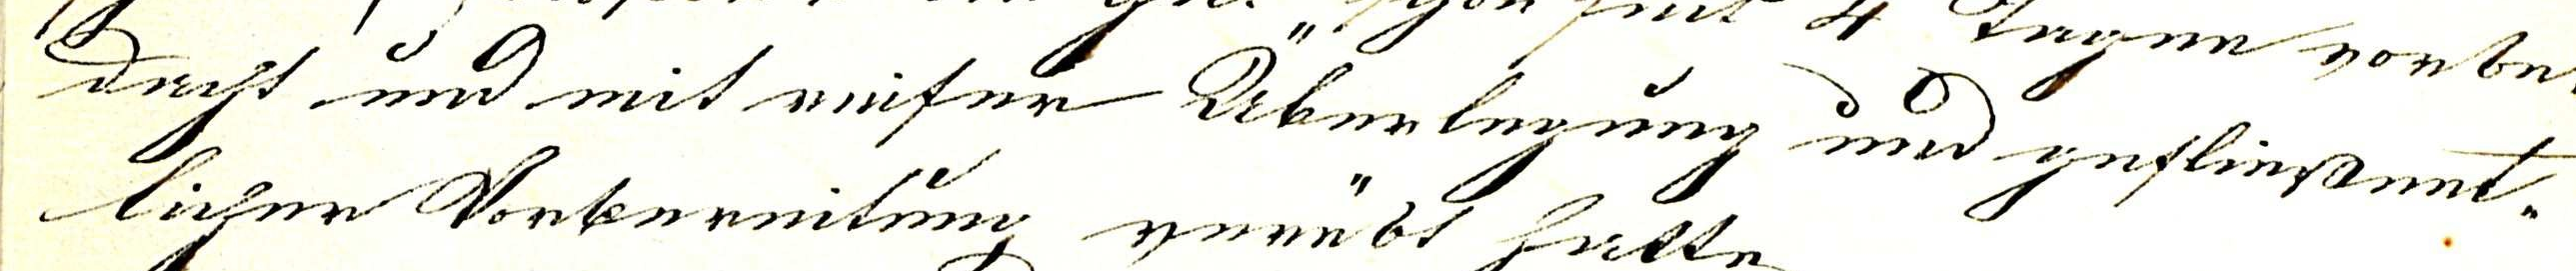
dacht und mit reifer Überlegung und gefließent¬
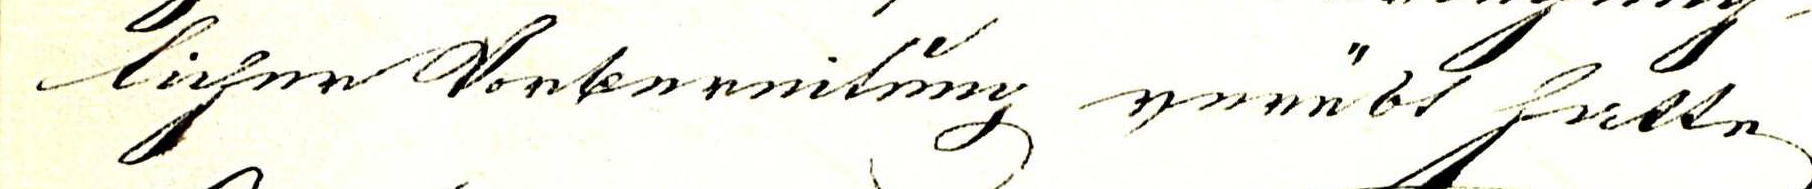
lichen Vorbereitung verübt hatte.
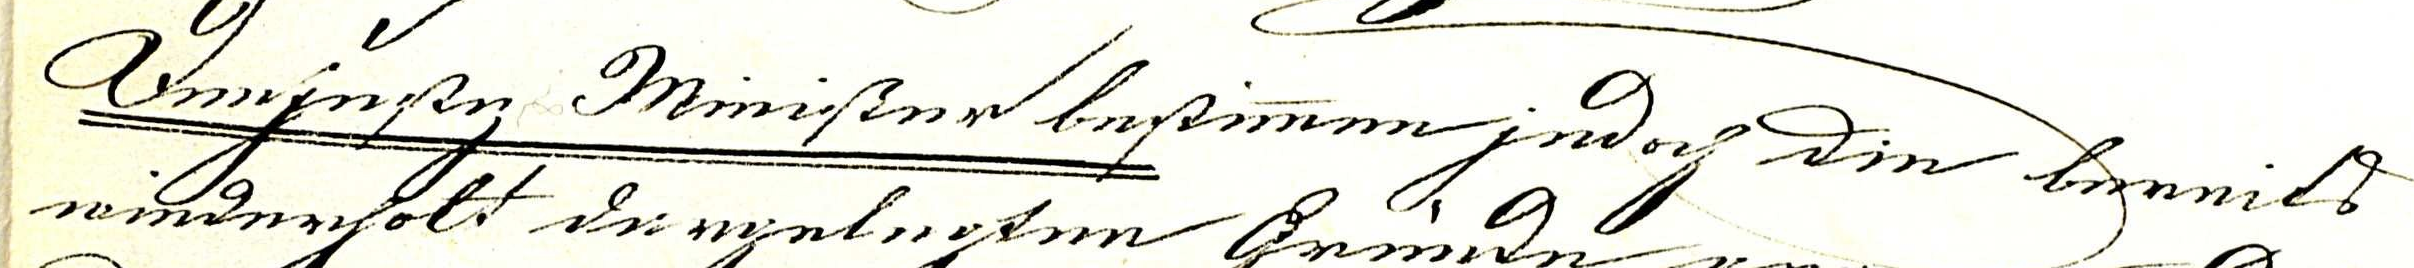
Der Justiz Minister bestimmen jedoch die bereits
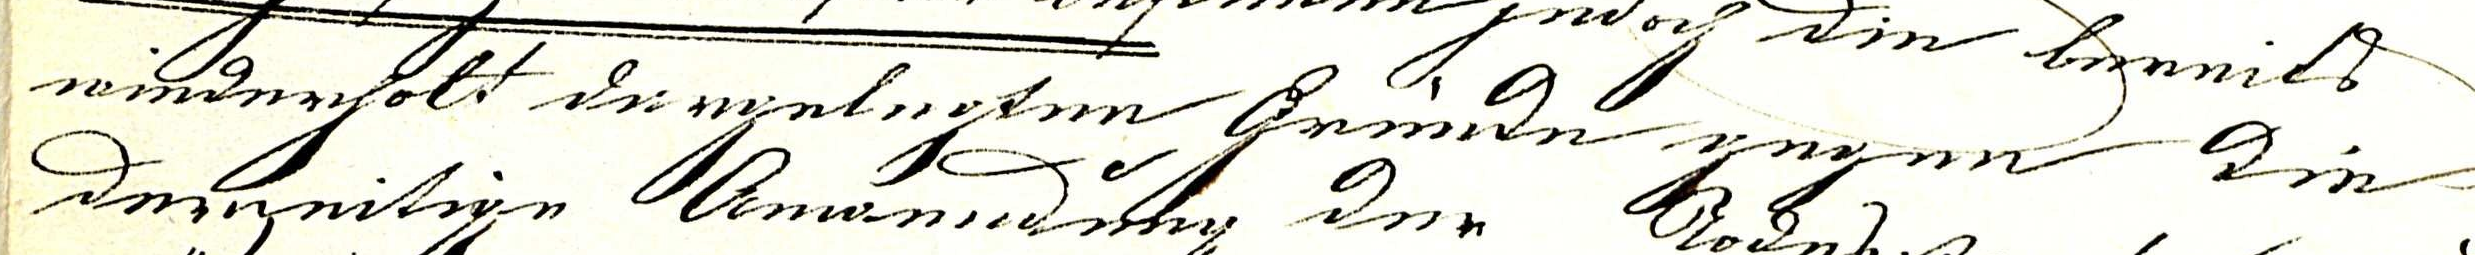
wiederholt dargelegten Gründe gegen die
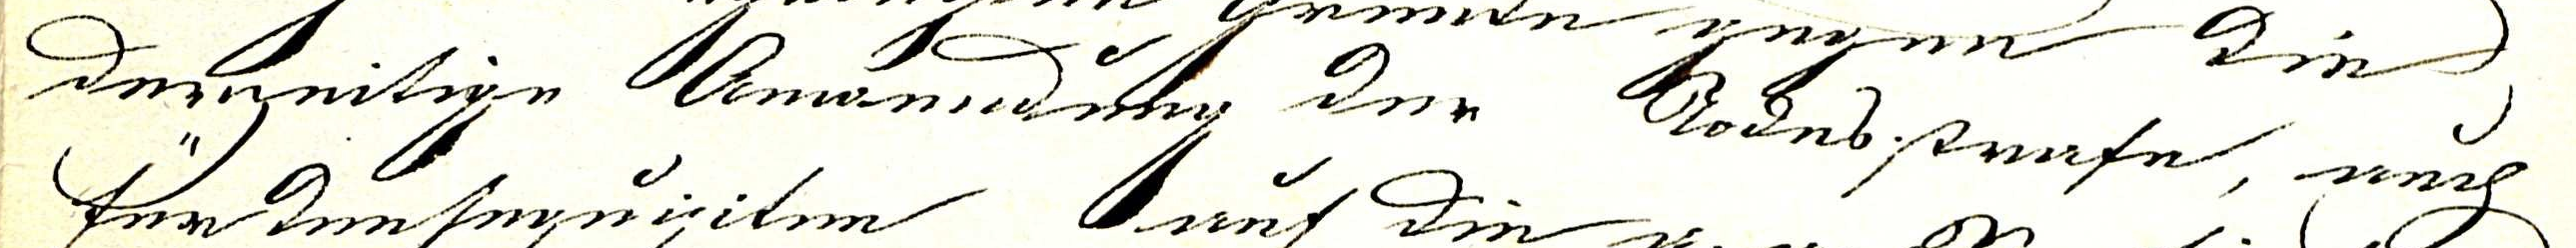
derzeitige Anwendung der Todesstrafe, auch
